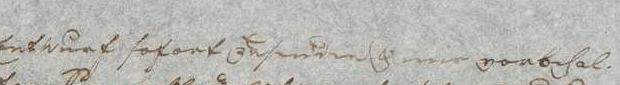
Entwurf sofort zusenden & mir vorbehal-
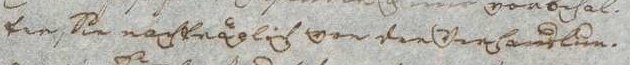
ten, Sie nachträglich von den Verhandlun-
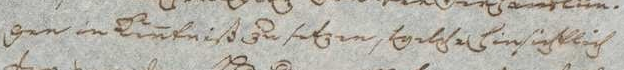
gen in Kenntniß zu setzen, welche hinsichtlich
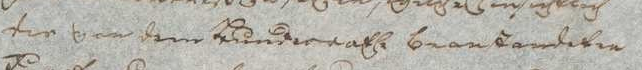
der von dem Bundesrathe beanstandeten
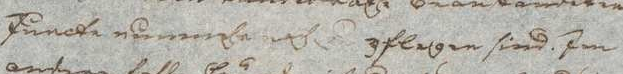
Puncte nunmehr noch zu pflegen sind. Im
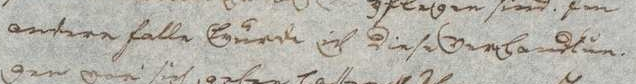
andern Falle würde ich diese Verhandlun-
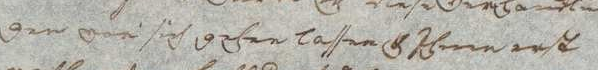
gen vor sich gehen lassen & Ihnen erst
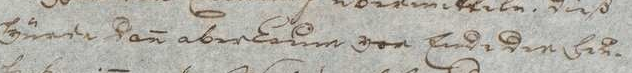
würde dann aber kaum vor Ende der heu-
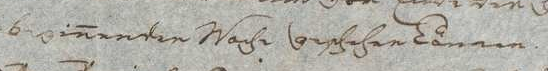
beginnenden Woche geschehen können.
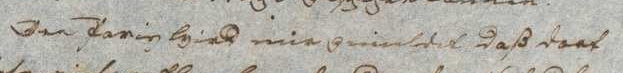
In Paris wird mir gemeldet, daß dort
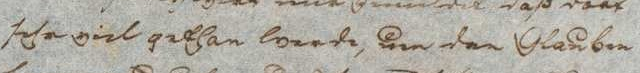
sehr viel gethan werde, um den Glauben
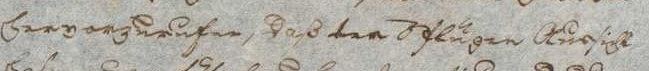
hervorzurufen, daß der Splügen Aussicht
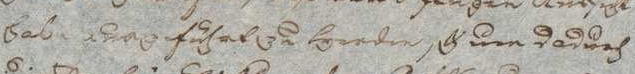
habe ausgeführt zu werden, & um dadurch
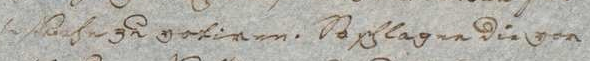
Bahn zu votiren. So schlagen die von
